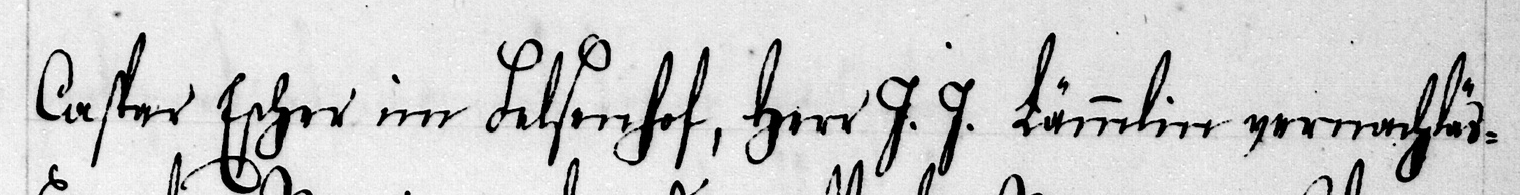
Caspar Escher im Felsenhof, Herr J. J. Lämmlin vernachlä¬
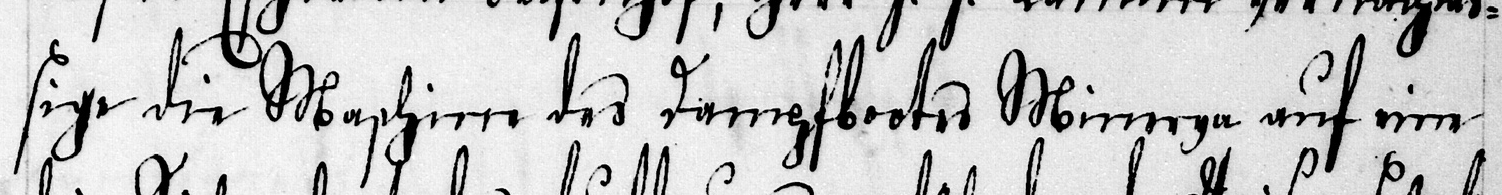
ßige die Maschine des Dampfbootes Minerva auf eine
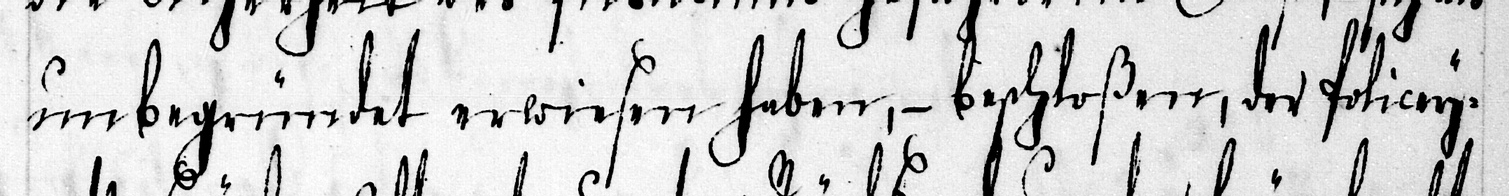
unbegründet erwiesen haben, – beschloßen, der Policey¬
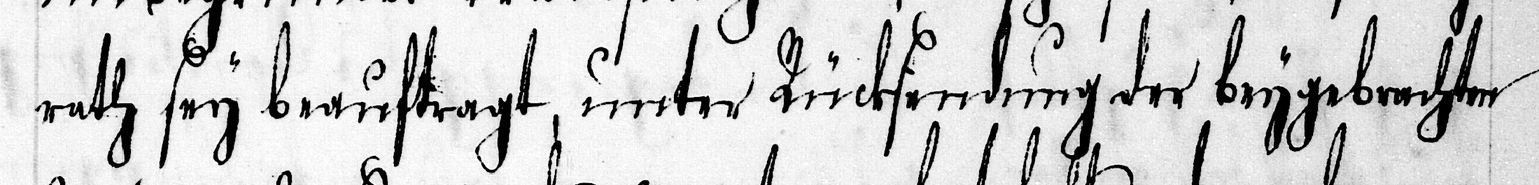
rath sey beauftragt, unter Rücksendung der beygebrachten
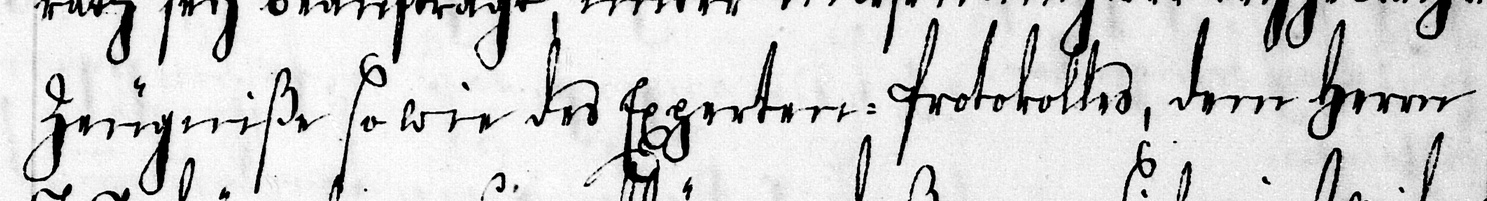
Zeugniße sowie des Experten-Protokolles, dem Herrn
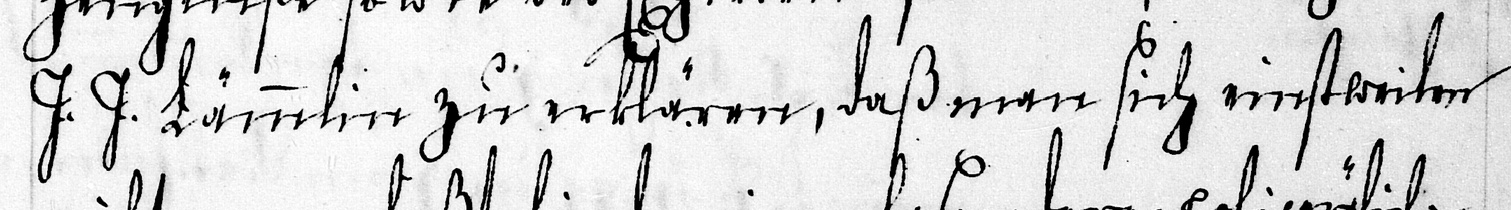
J. J. Lämmlin zu erklären, daß man sich einstweilen
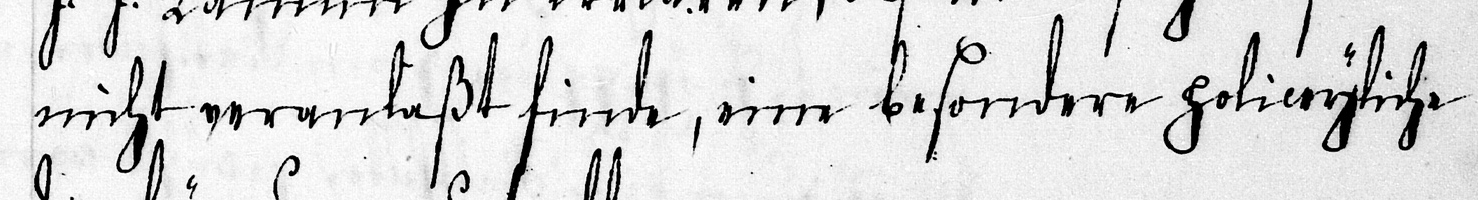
nicht veranlaßt finde, eine besondere policeyliche
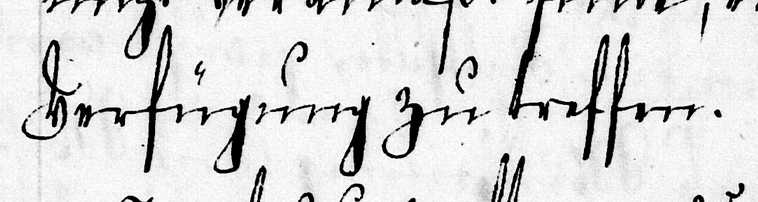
Verfügung zu treffen.
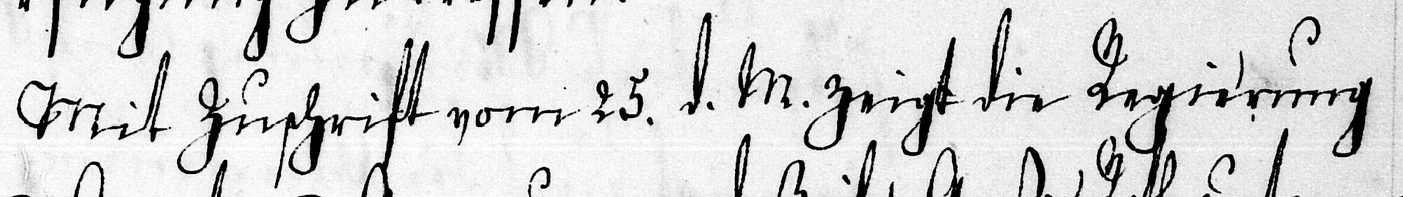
Mit Zuschrift vom 25. d. M. zeigt die Regierung
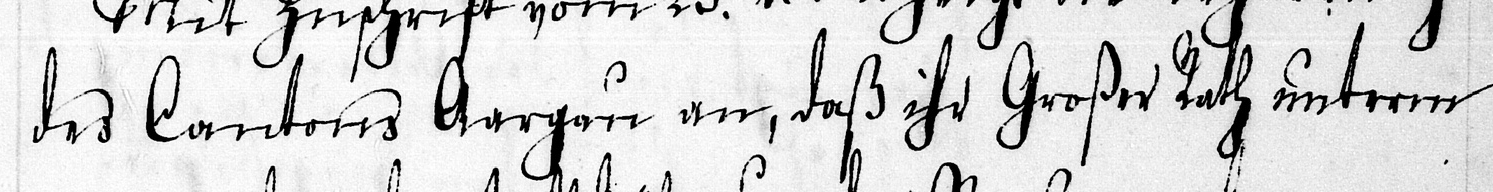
des Cantons Aargau an, daß ihr Großer Rath unterm
